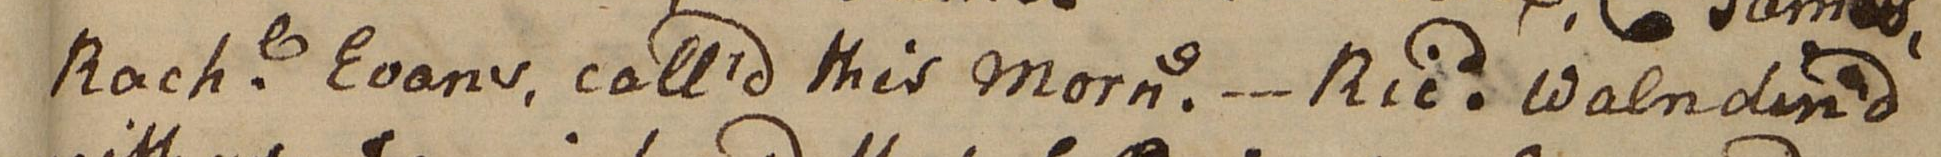Rach^l. Evans, call'd this morn^g.- Ric^d. Waln din'd
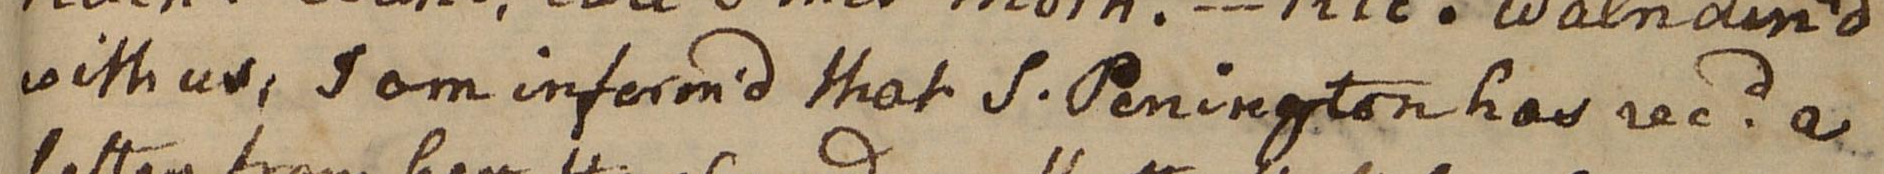with us, I am inform'd that S. Penington has rec^d. a
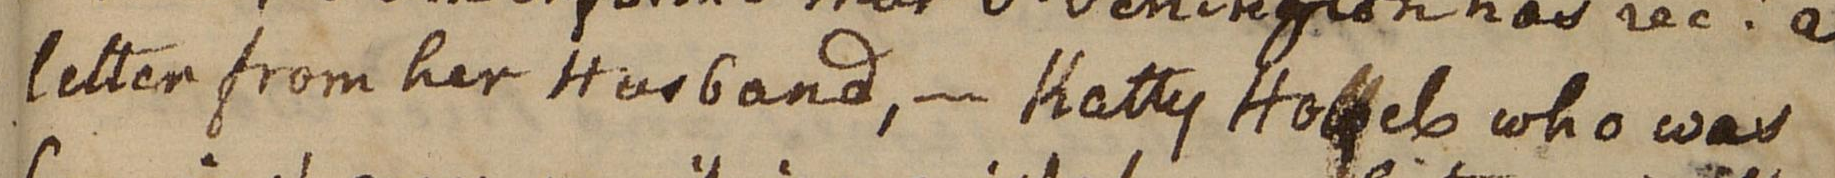letter from her Husband,- Katty Howel who was
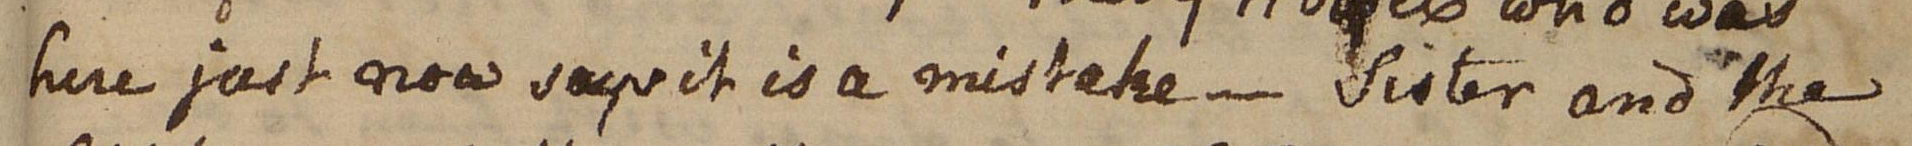here just now says it is a mistake- Sister and the
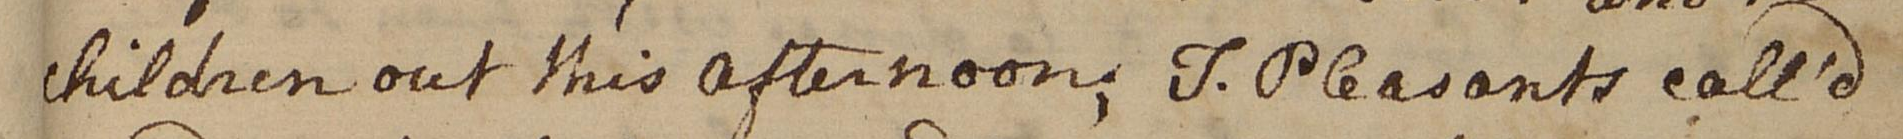children out this afternoon, S. Pleasants call'd
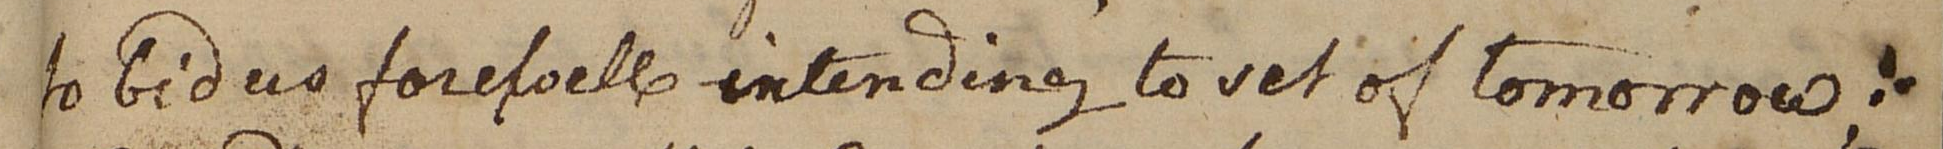to bid us farewell intending to set of tomorrow,
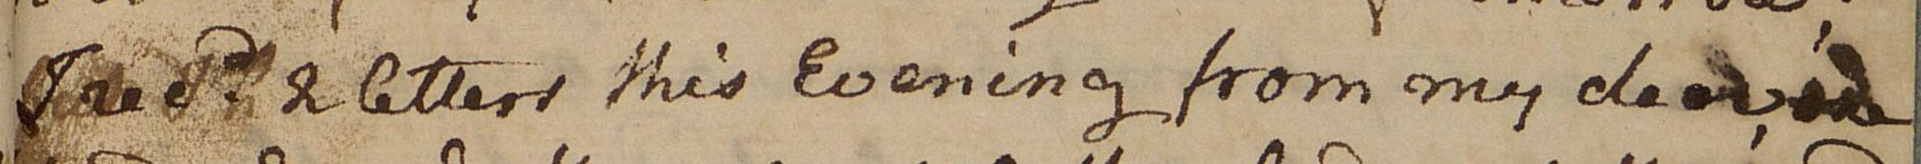I rec'd 2 letters this Evening from my dear, [__]
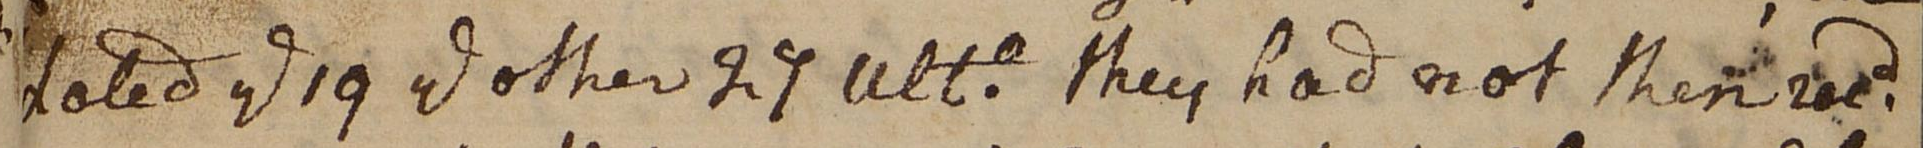dated y^e 19 y^e other 27 Ult^o. they had not then rec^d.
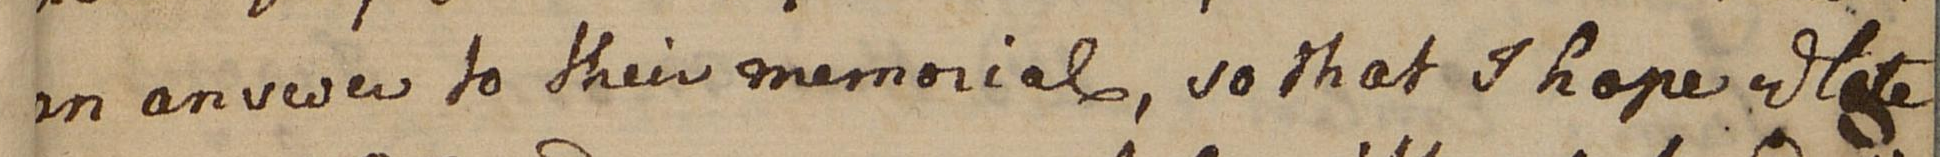an answer to their memorial, so that I hope y^e late
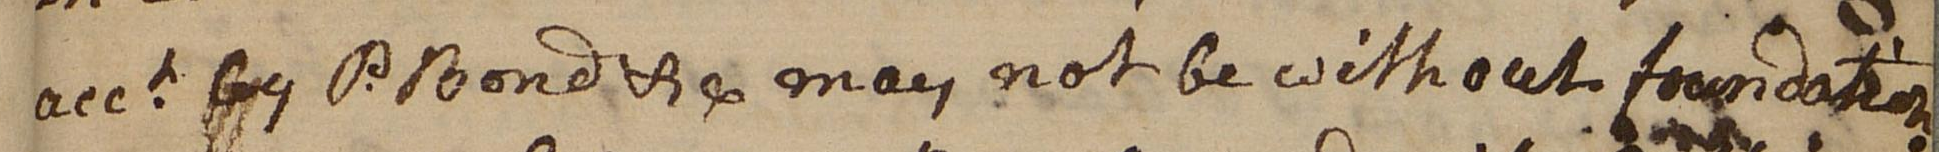acc^t. by P. Bond &c may not be without foundation
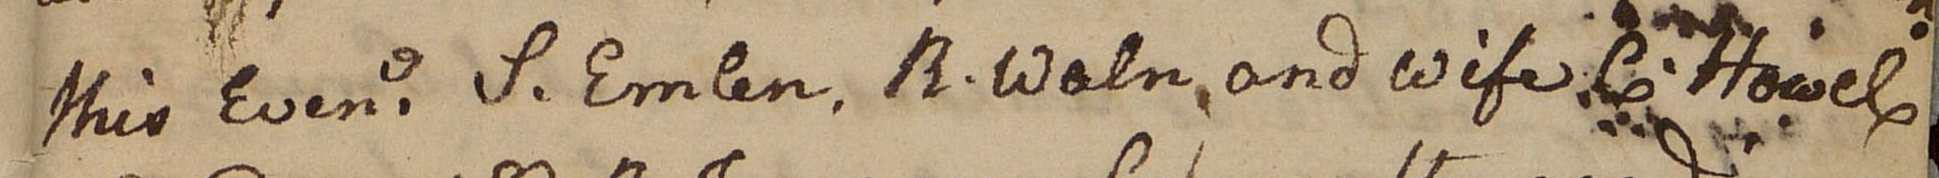this Even^g. S. Emlen, R. Waln, and Wife C. Howel
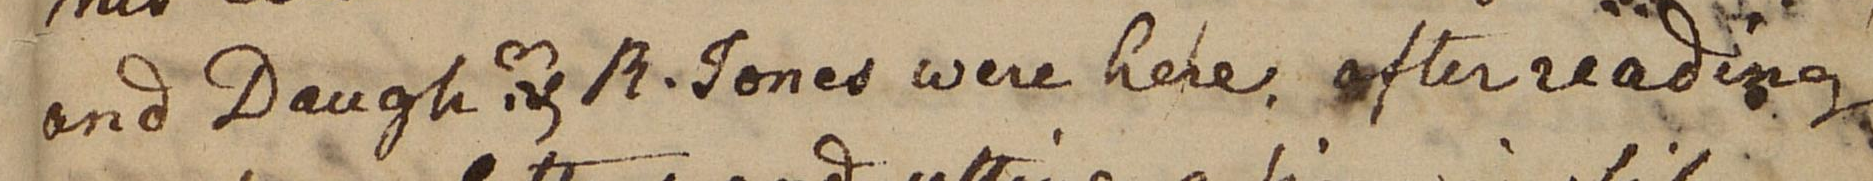and Daugh^r. & R. Jones were here, after reading
